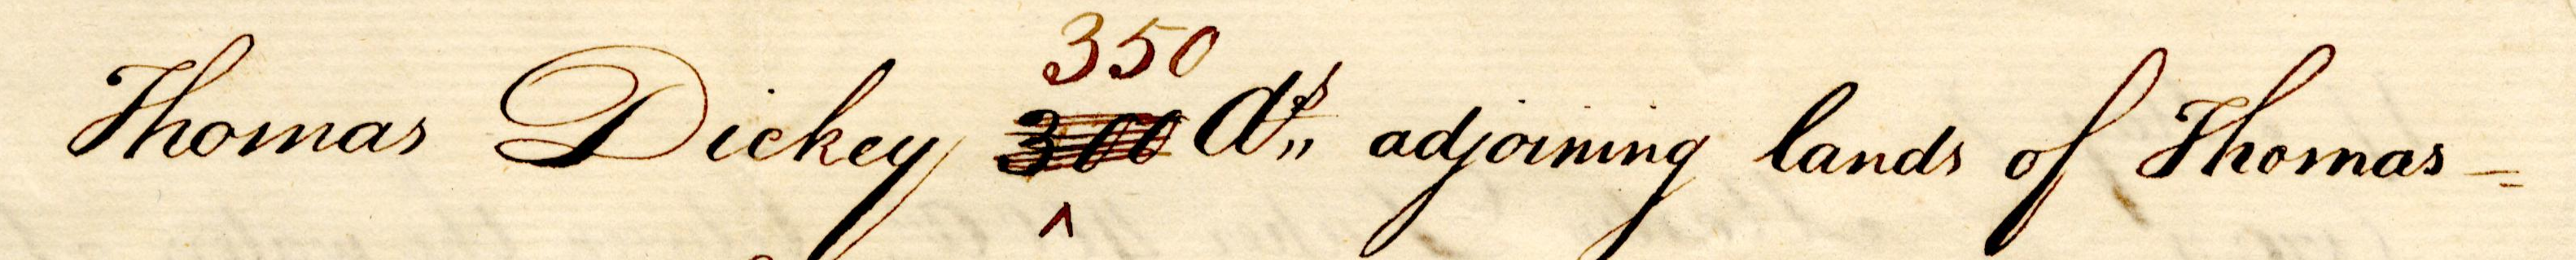Thomas Dickey [300] a^s adjoining lands of Thomas-
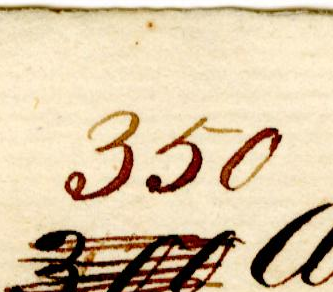350
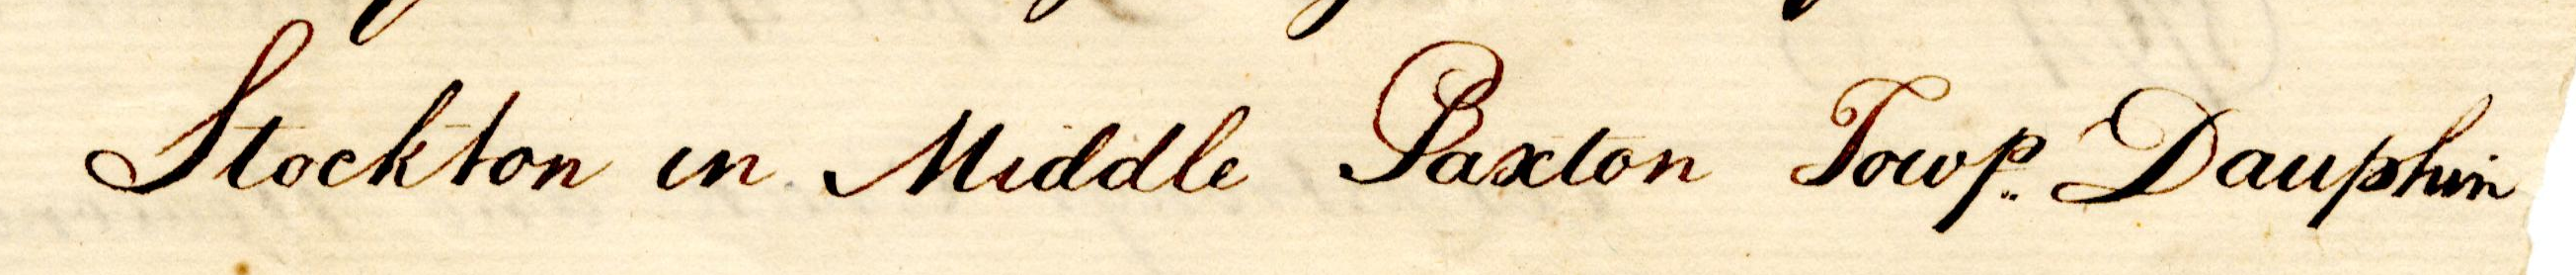Stockton in Middle Paxton Tow^p. Dauphin
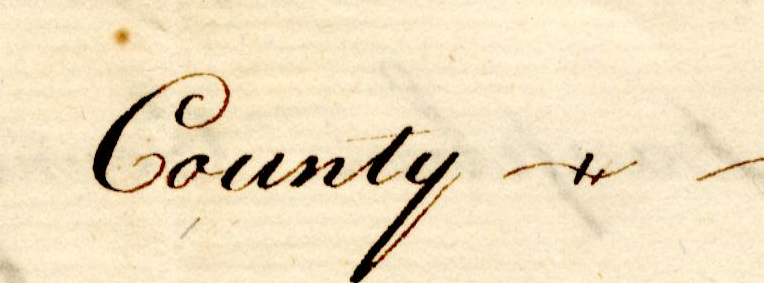County-
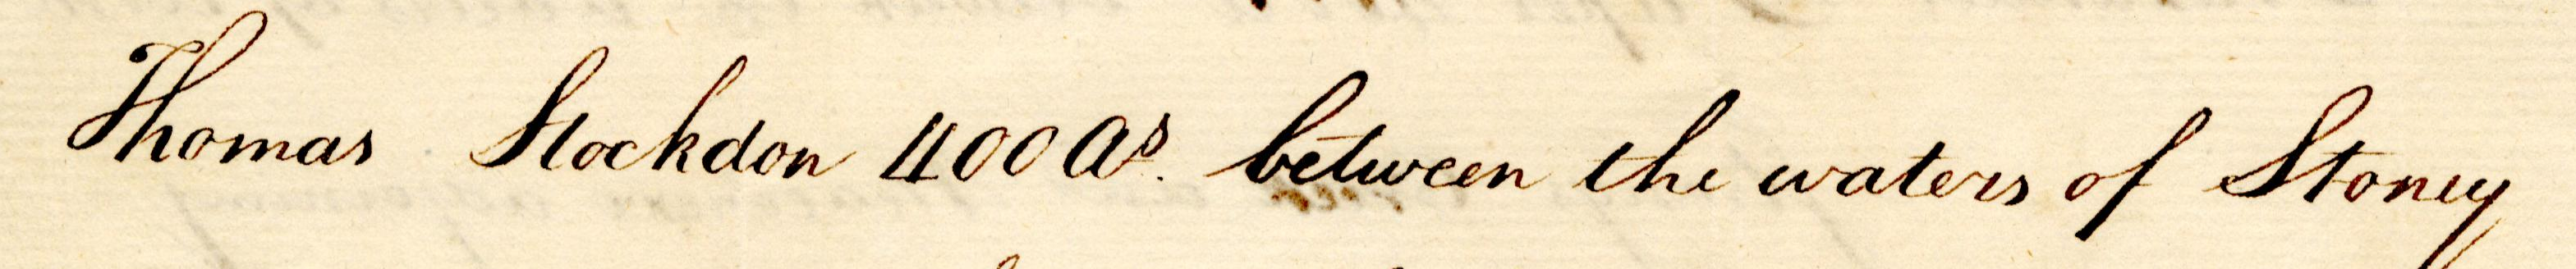Thomas Stockdon 400 A^s. between the waters of Stoney
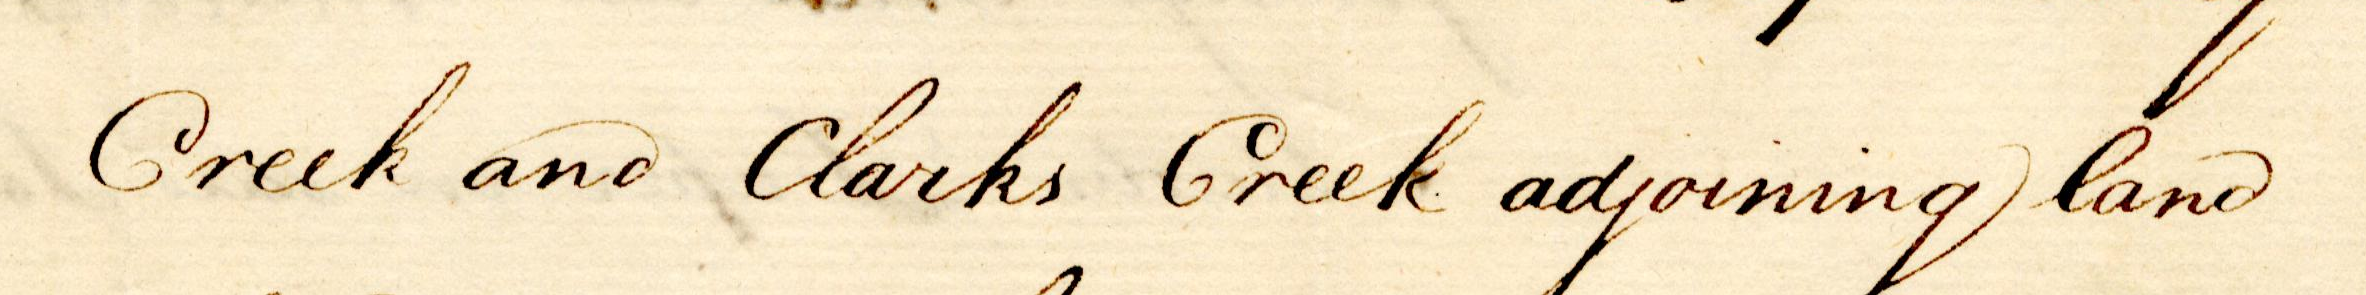Creek and Clark's Creek adjoining land
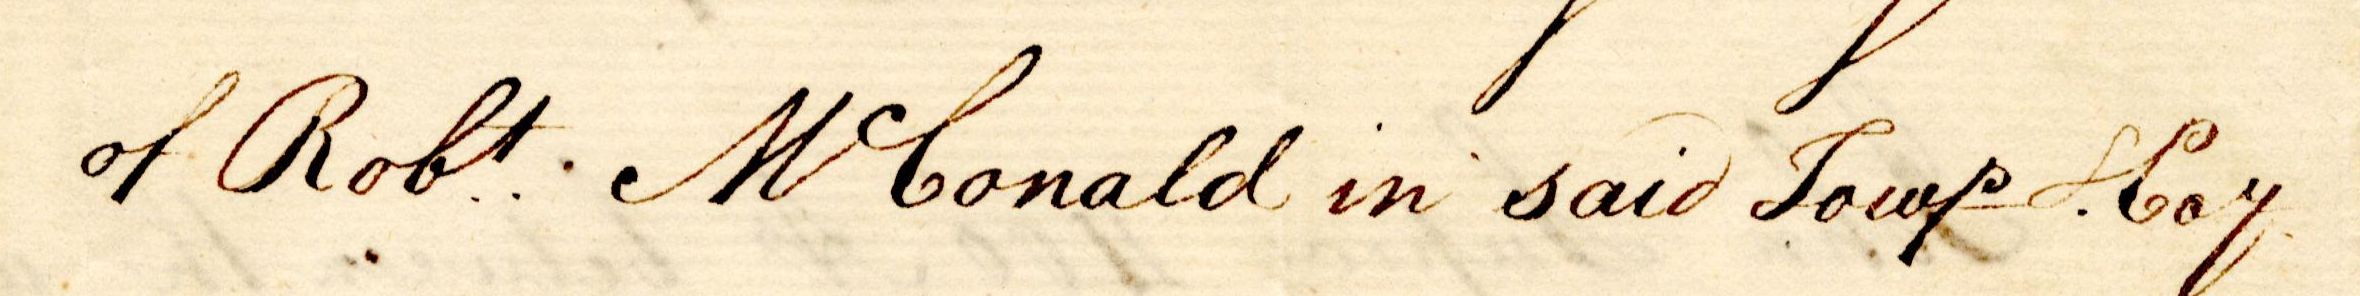of Rob^t. M^cConald in said Tou^p & Coy
